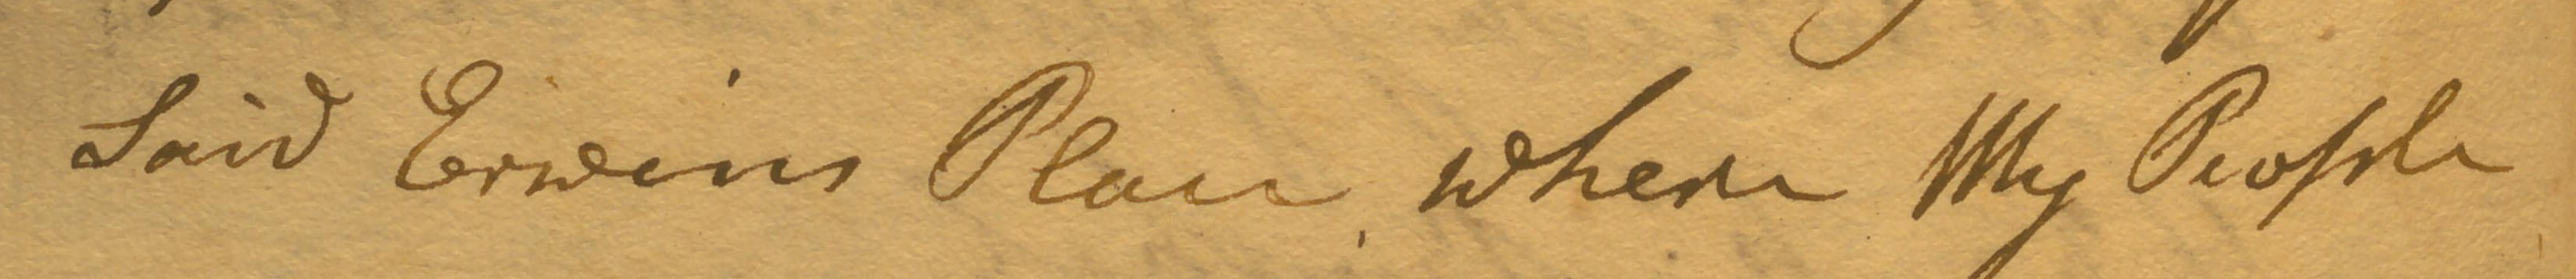said Erwins Place where My People
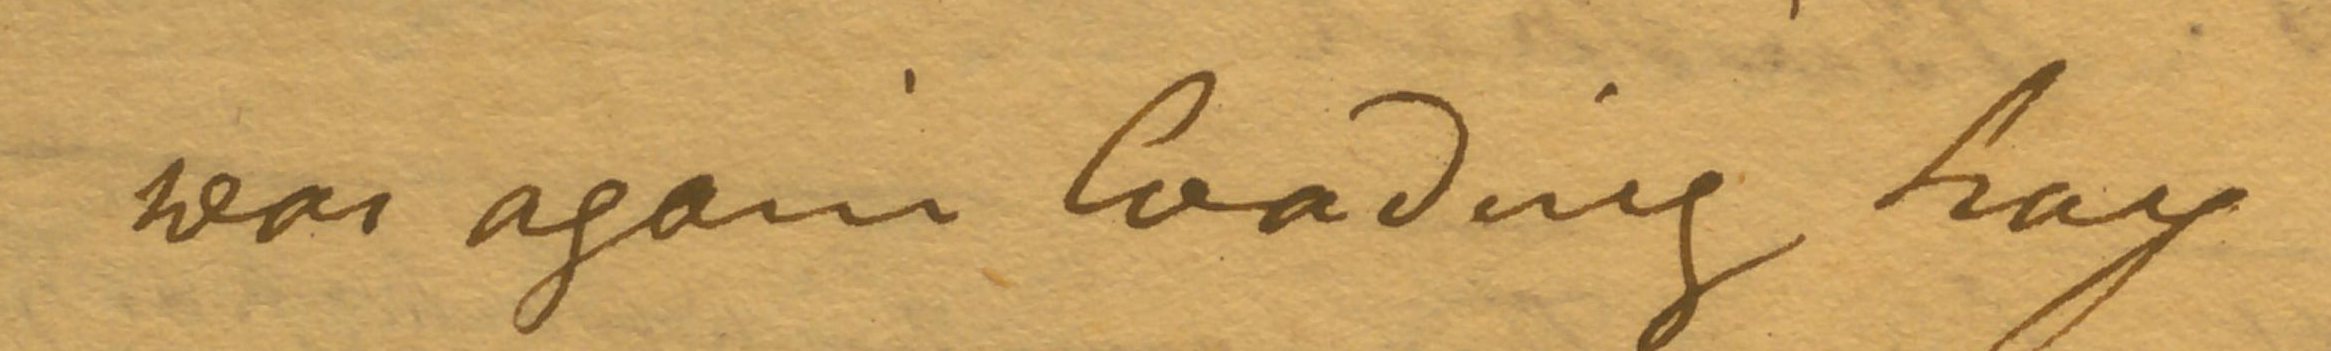was again loading hay
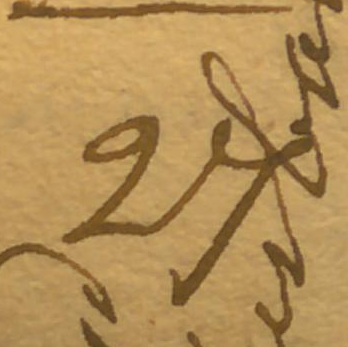27
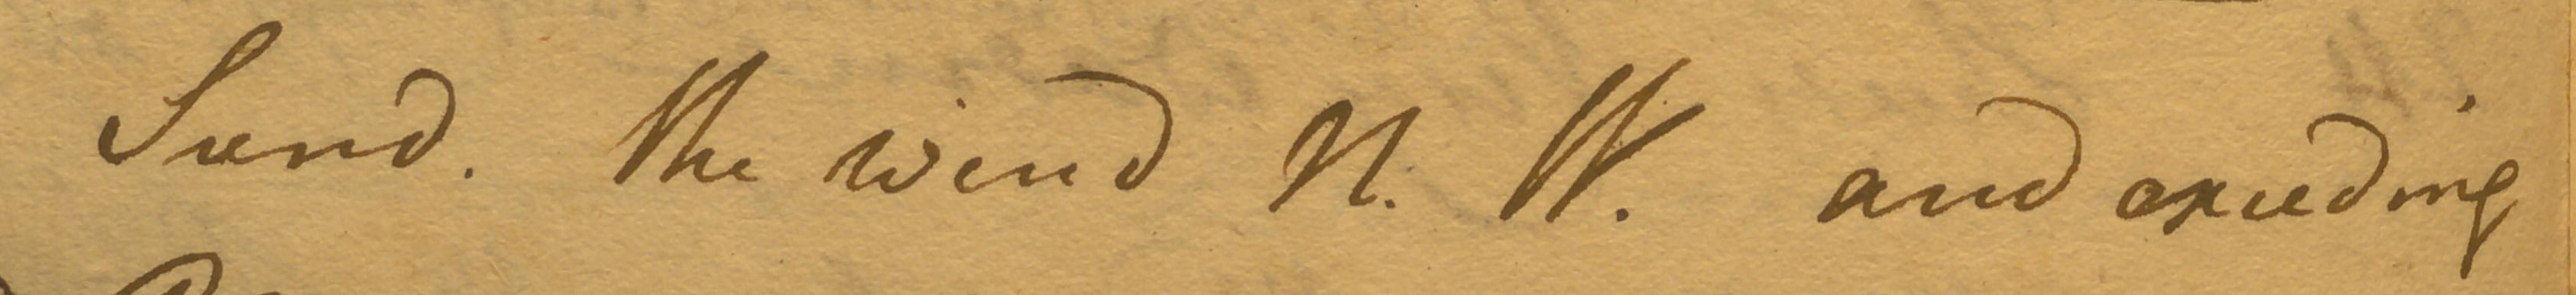Sund. the wind M W. and exceding
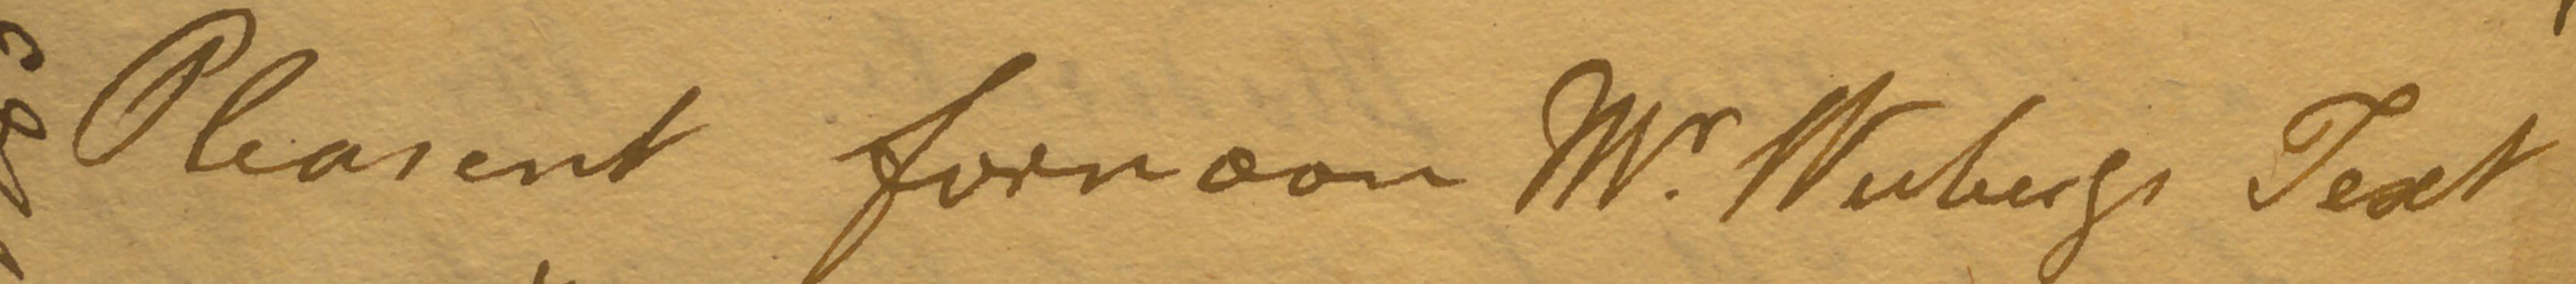Pleasent fornoon M^r. Weibergs Text
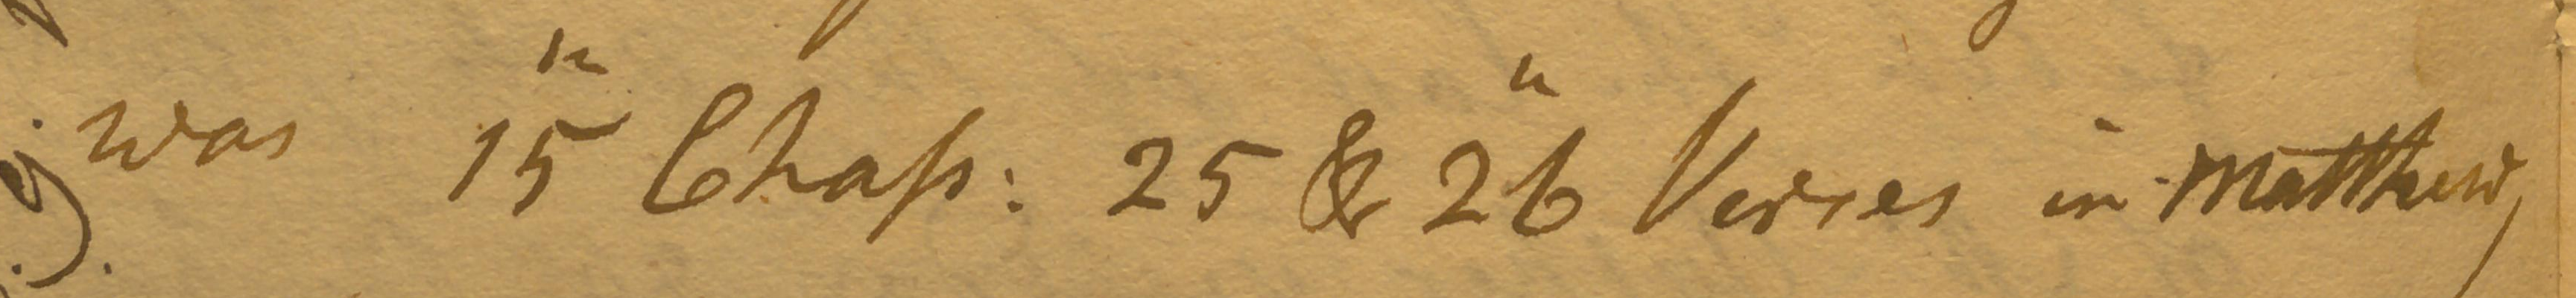was 15^th Chap. 25 & 26^th Verses in matthew
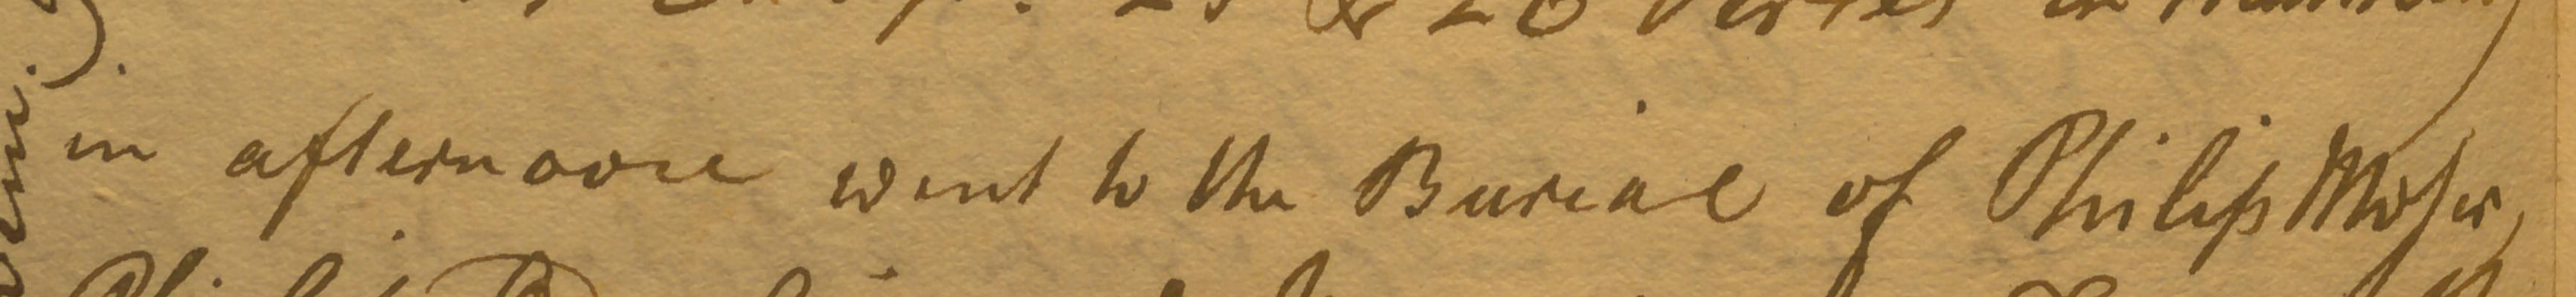in afternoon went to the Burial of Philip Moser
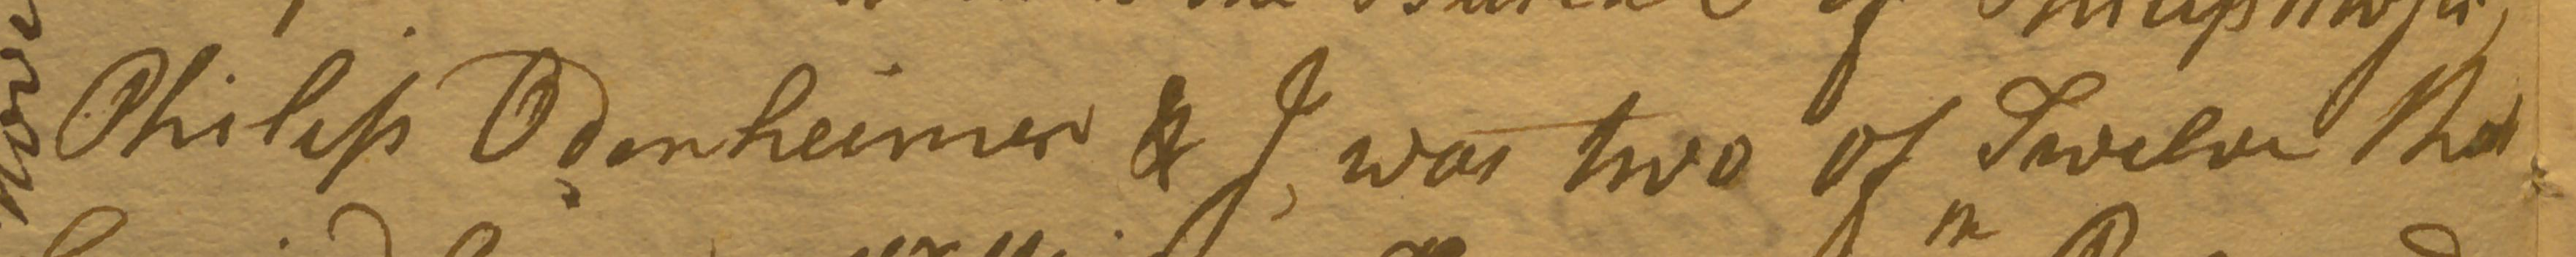Philip Odenheimer & I was two of Trauler the
